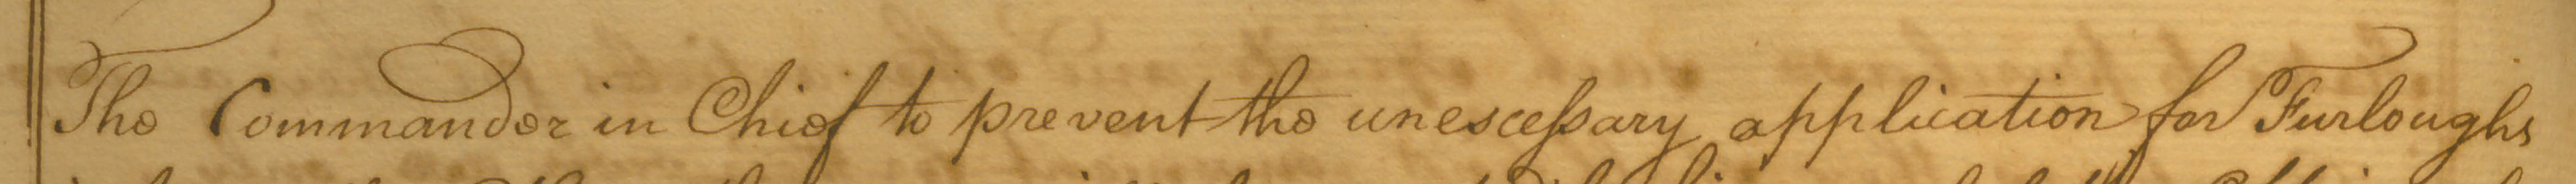The Commander in Chief to prevent the unescessary application for Furloughs
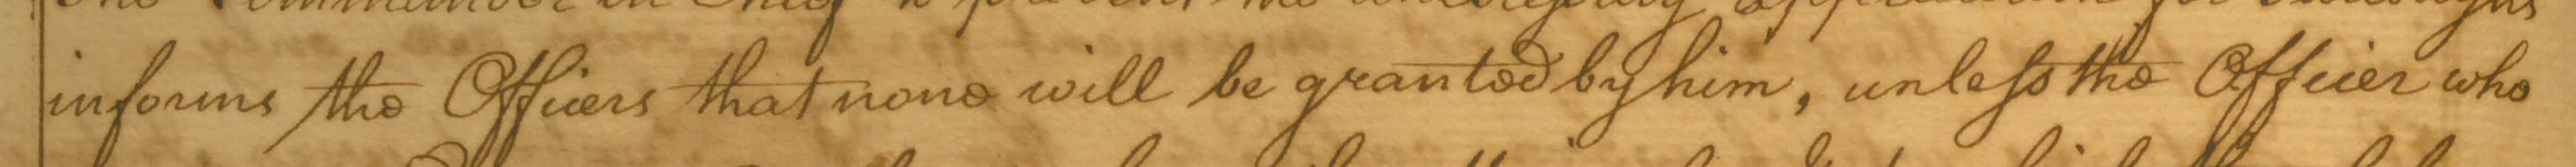informs the Officers that none will be granted by him, unless the Officer who
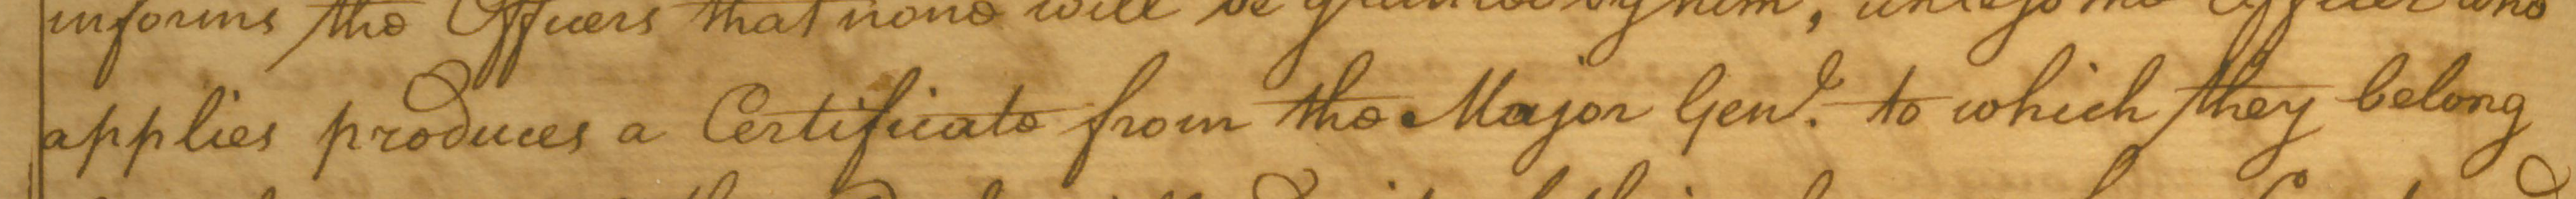applies produces a Certificate from the Major Gen^l. to which they belong
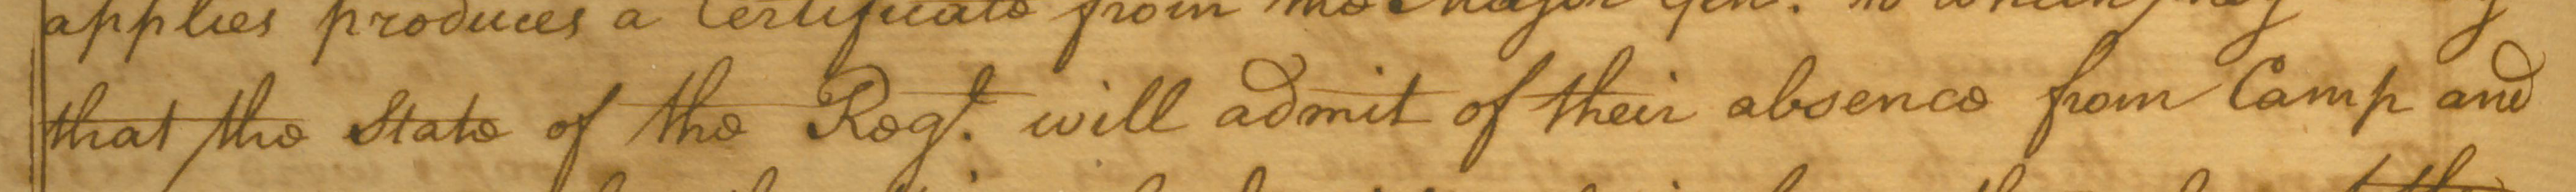that the State of the Reg^t. will admit of their absence from Camp and
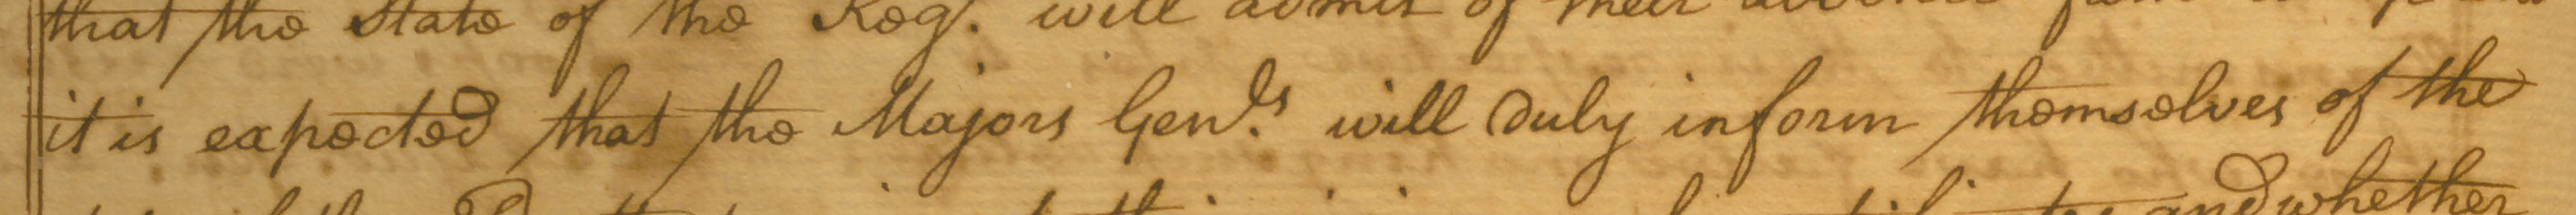it is expected that the Majors Gen^ls. will duly inform themselves of the
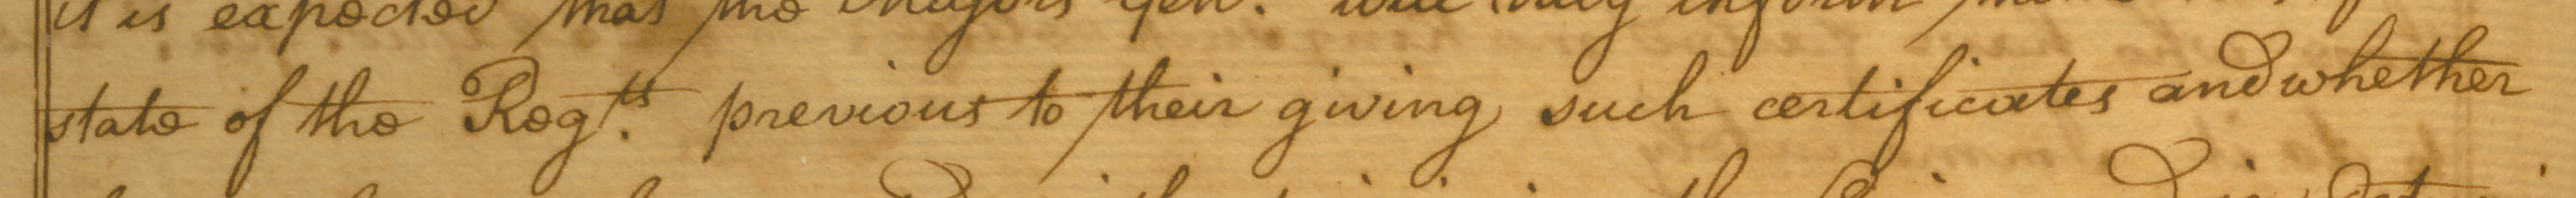state of the Reg^ts. previous to their giving such certificates and whether
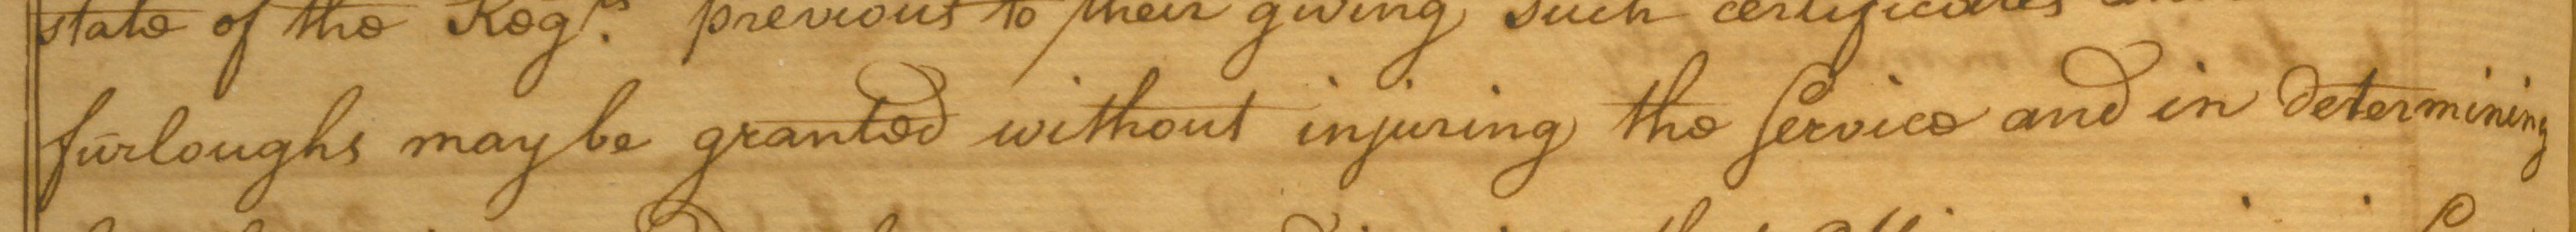furloughs may be granted without injuring the Service and in determining
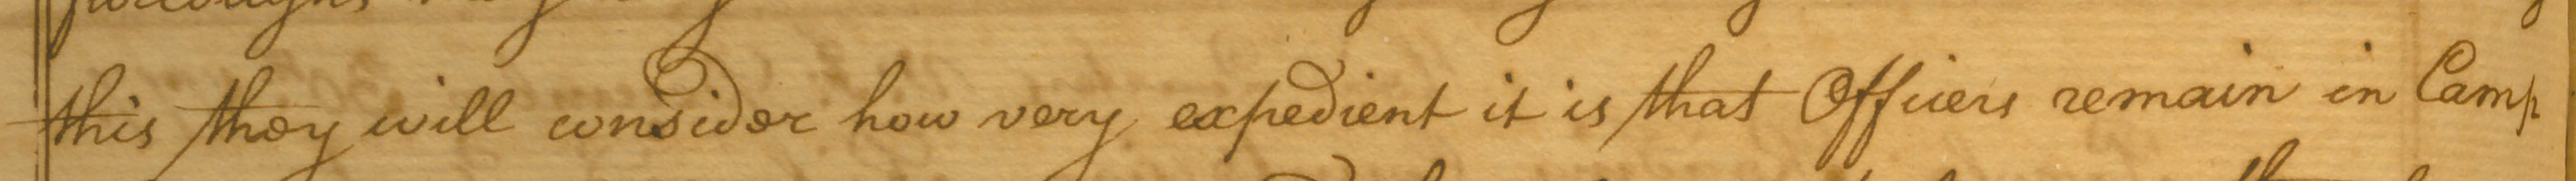this they will consider how very expedient it is that Officers remain in Camp
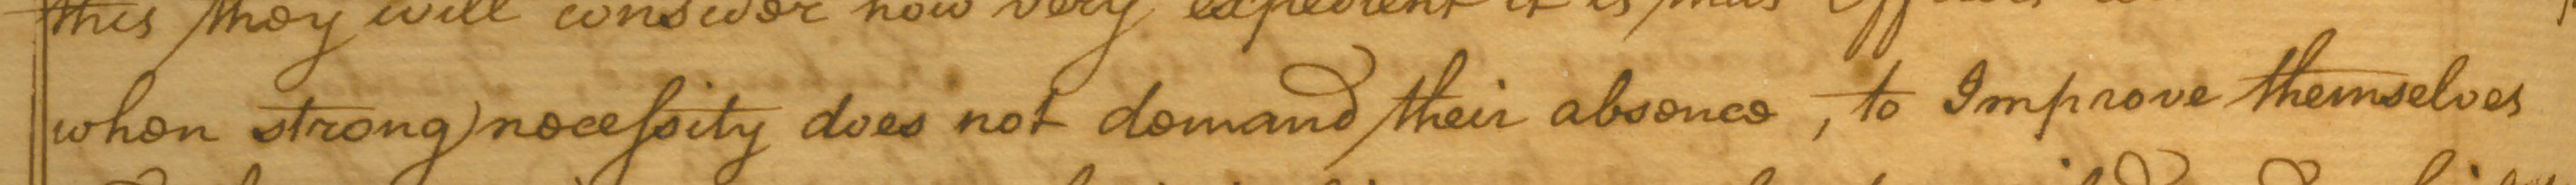when strong necessity does not demand their absence, to Improve themselves
